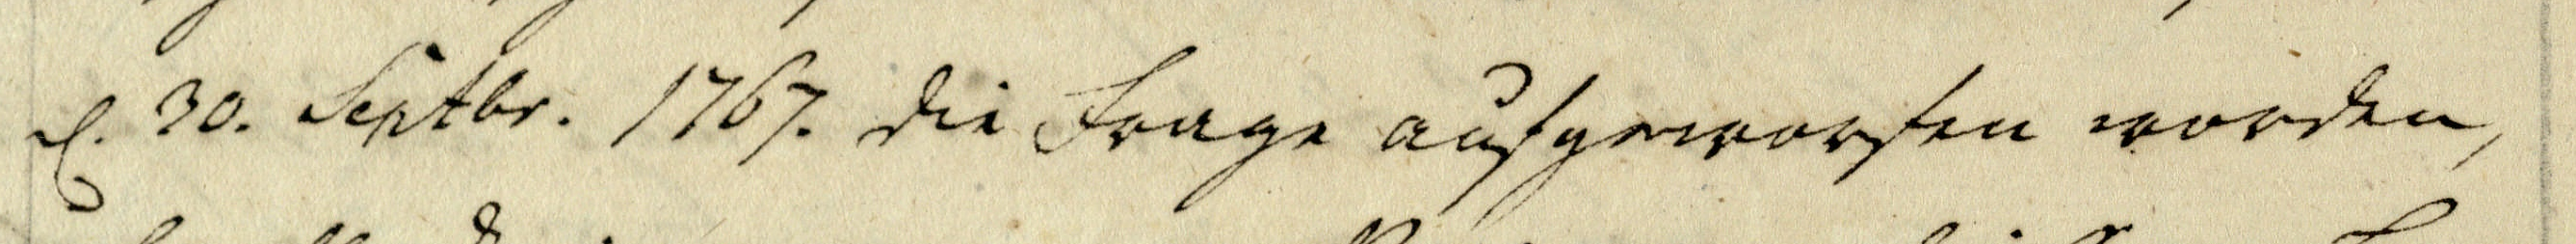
d. 30. Septbr. 1767. die Frage aufgeworfen worden,
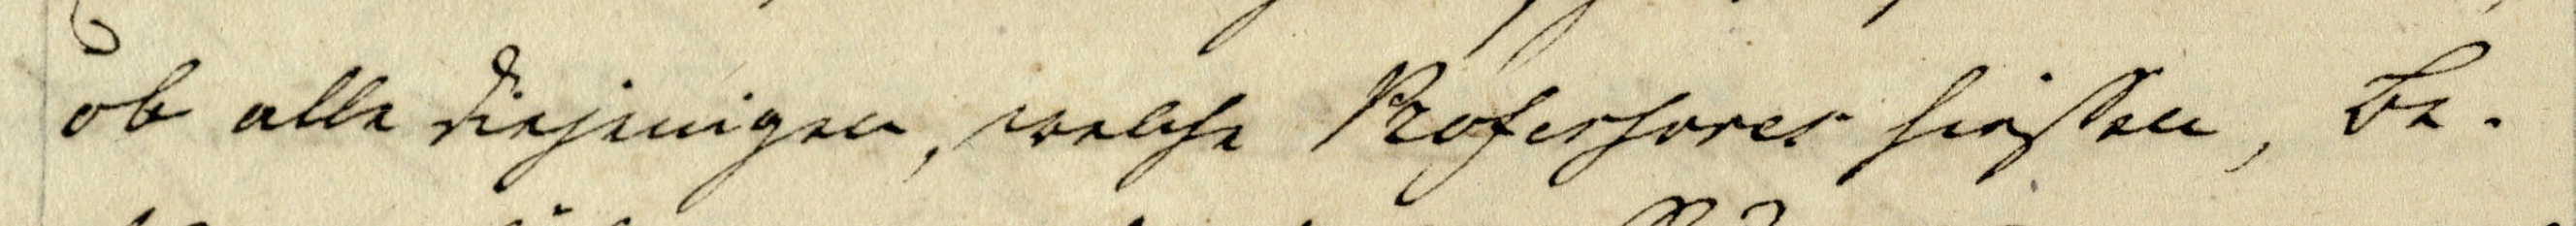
ob alle diejenigen, welche Professores hiessen, Be¬
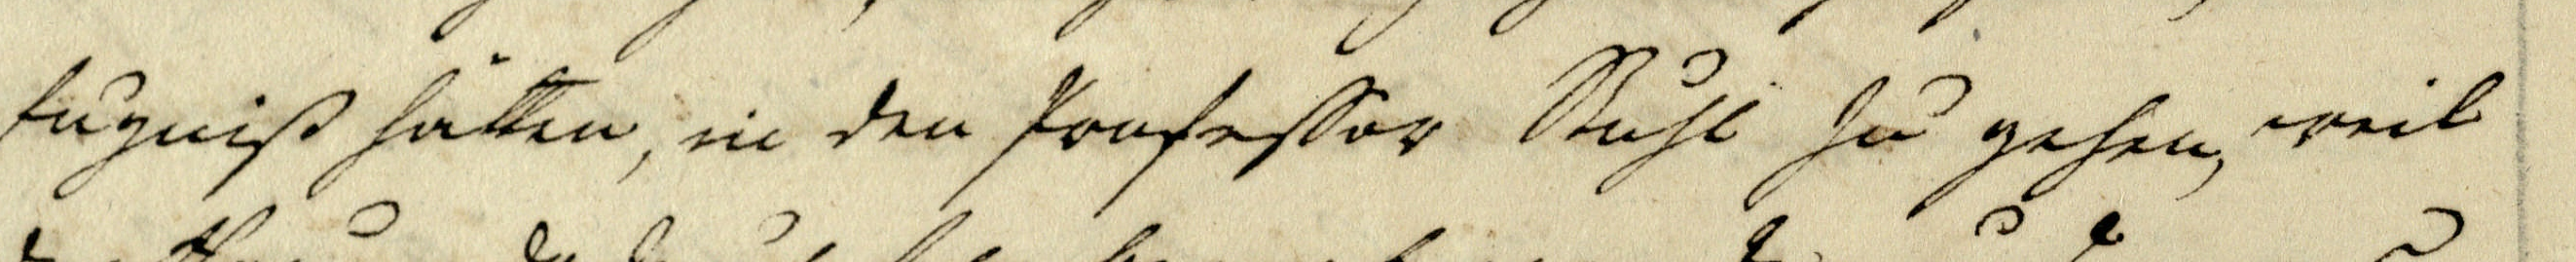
fugniß hätten, in den Professor Stuhl zu gehen, weil
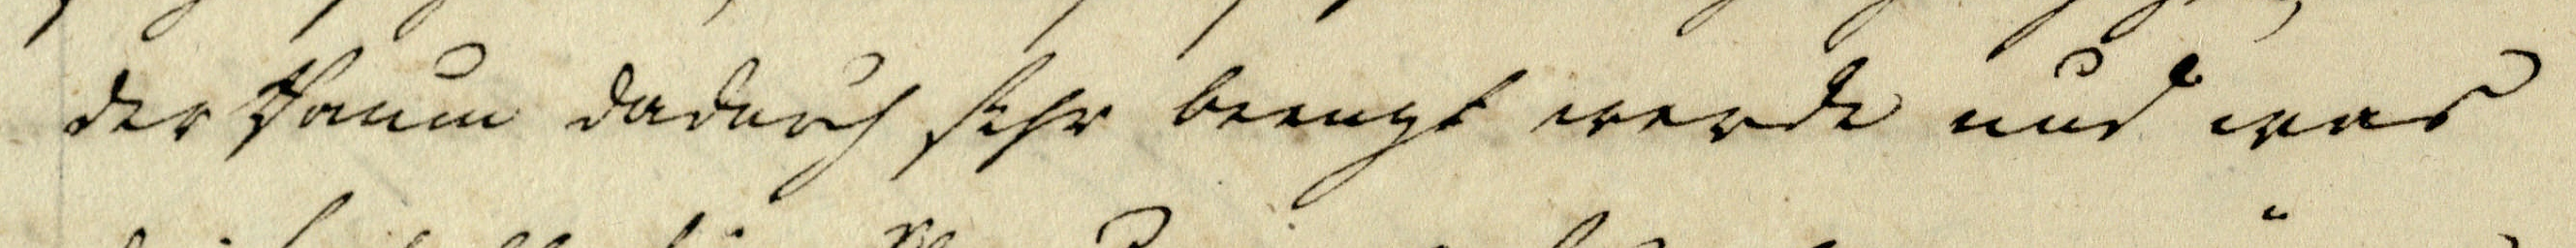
der Raum dadurch sehr beengt werde und was
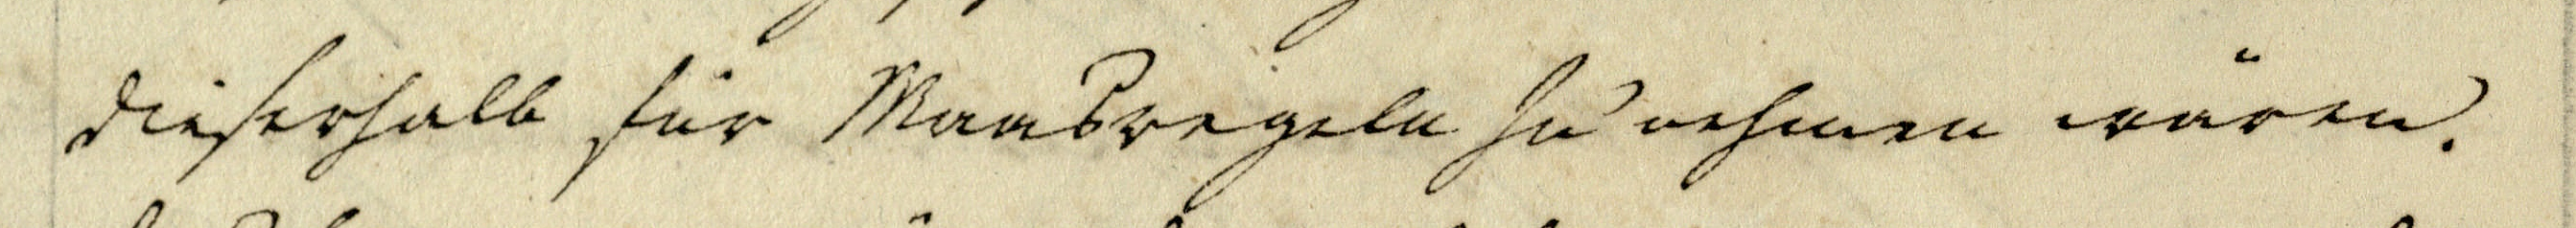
dieserhalb für Maasregeln zu nehmen wären.
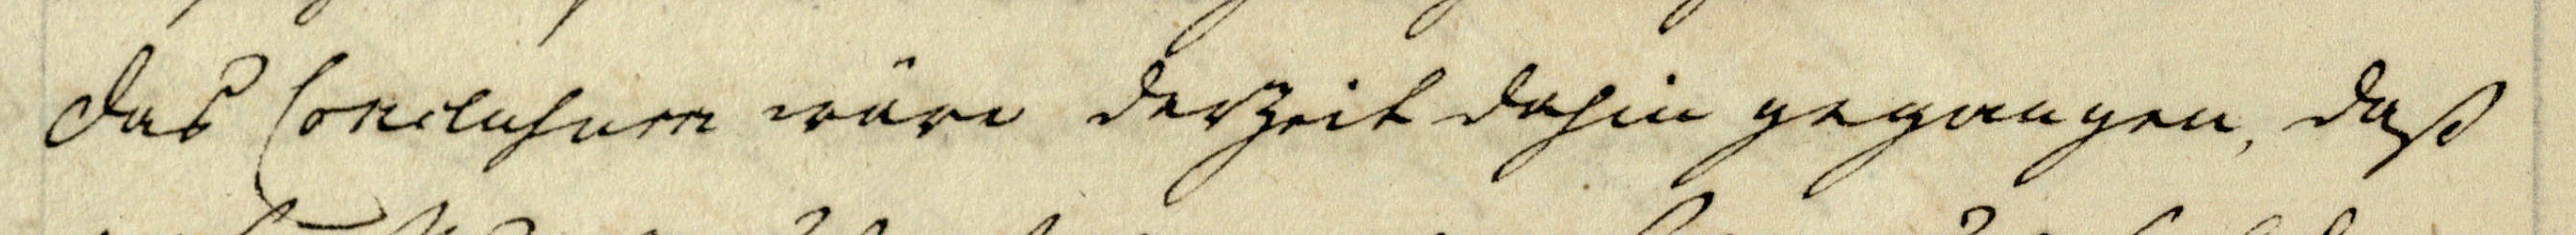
Das Conclusum wäre derzeit dahin gegangen, daß
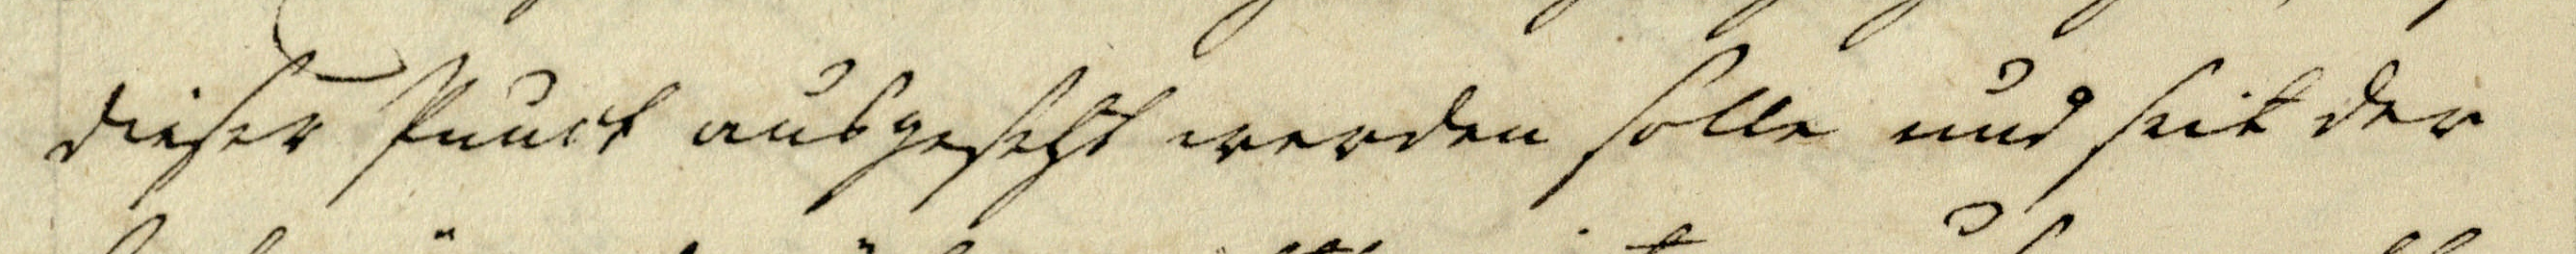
dieser Punct ausgesetzt werden solle und seit der
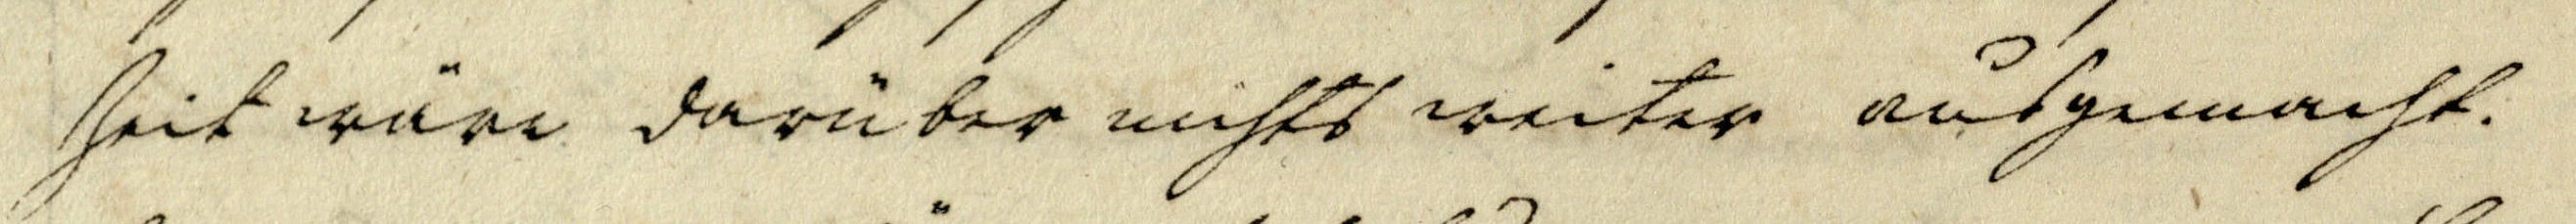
Zeit wäre darüber nichts weiter ausgemacht.
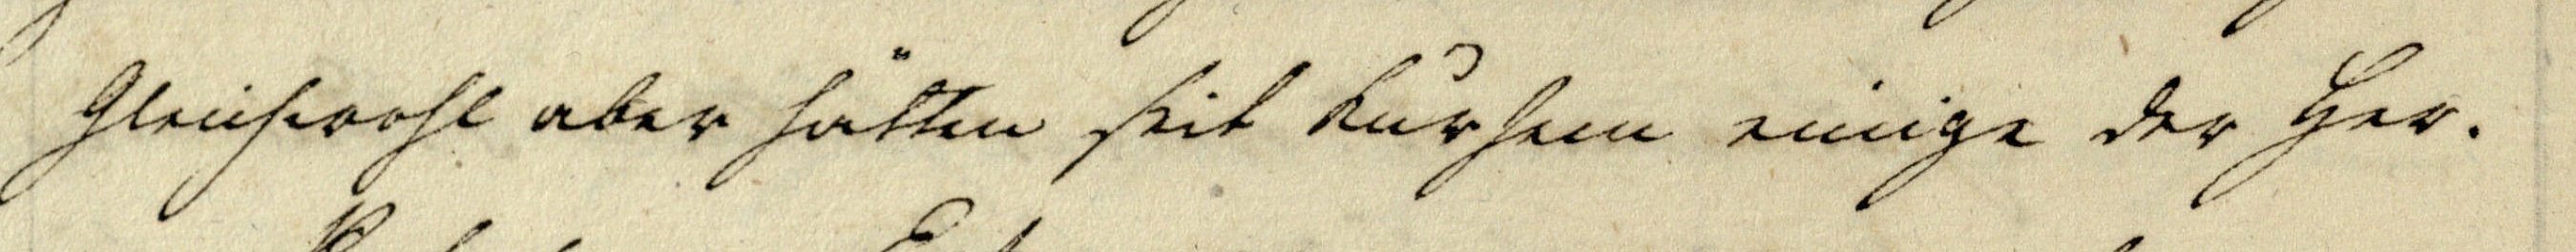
Gleichwohl aber hätten seit kurzem einige der Her¬
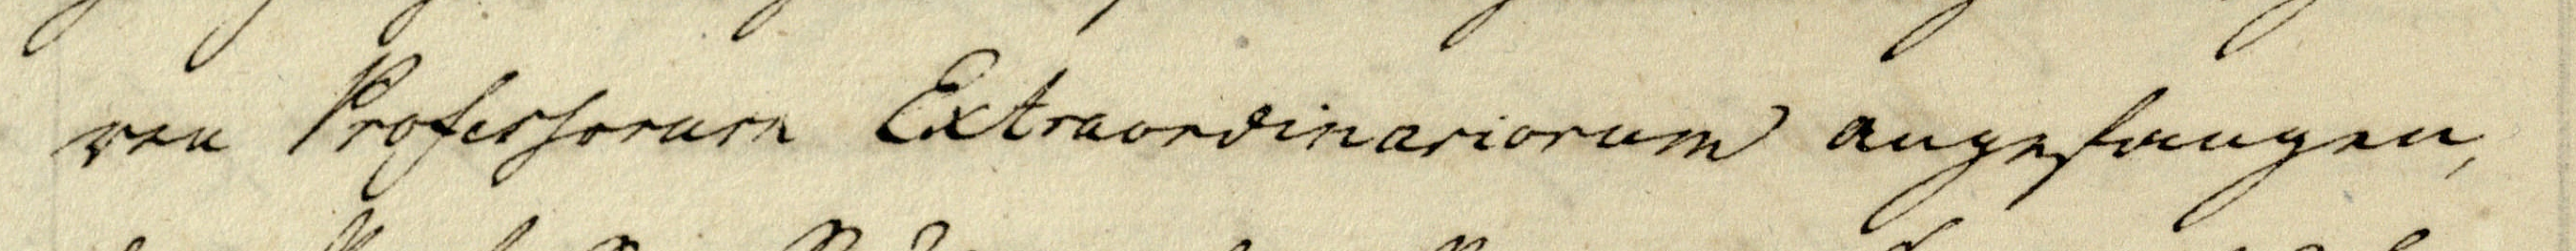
ren Professorum Exdtraoedinariorum angefangen,
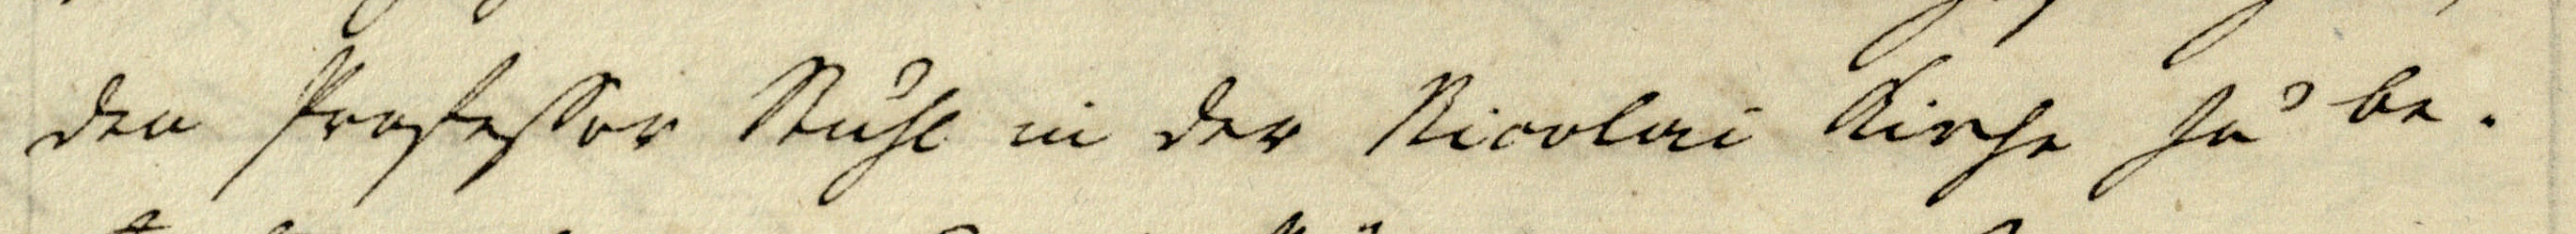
den Professor Stuhl in der Nicolai Kirche zu be¬
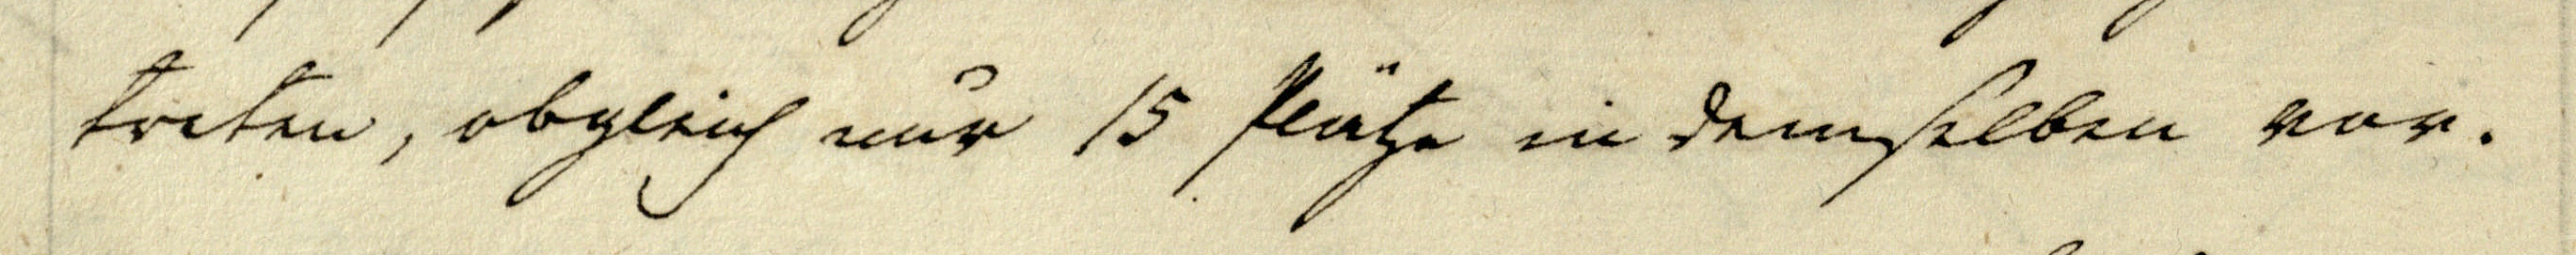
treten, obgleich nur 15 Plätze in demselben vor¬
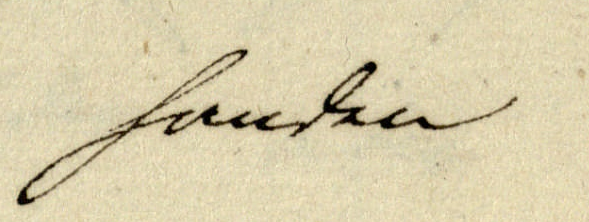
handen
